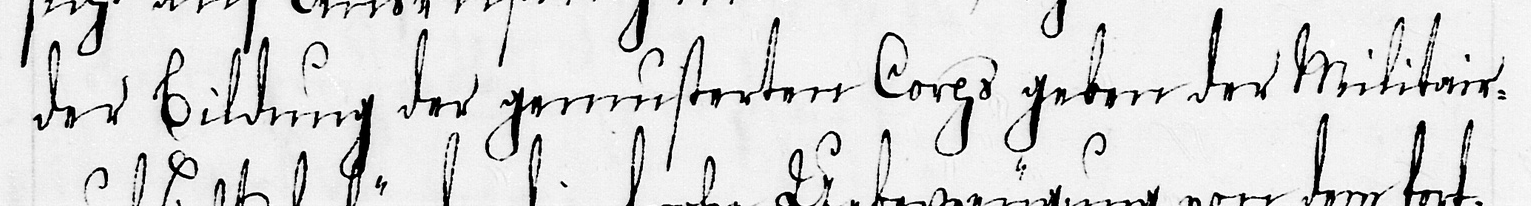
der Bildung der gemusterten Corps geben der Militair¬
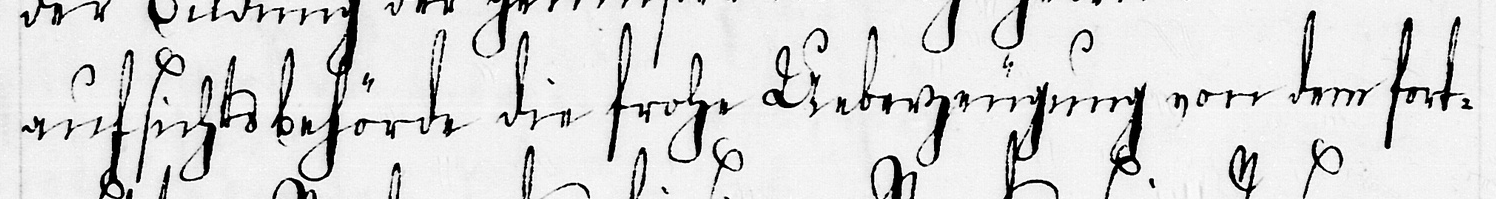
aufsichtsbehörde die frohe Ueberzeugung von dem fort¬
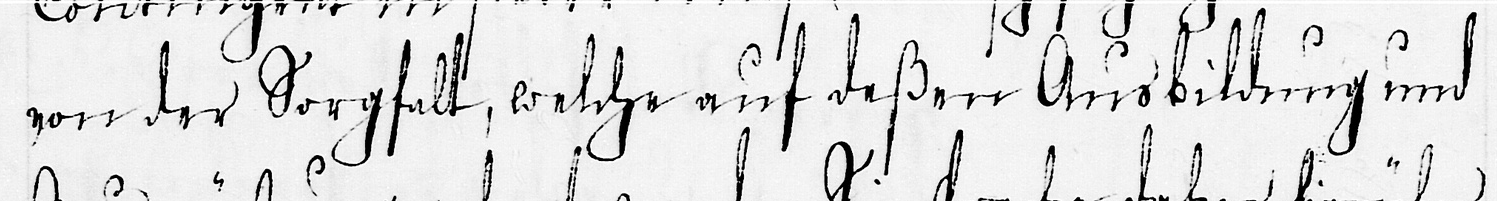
von der Sorgfalt, welche auf deßen Ausbildung und
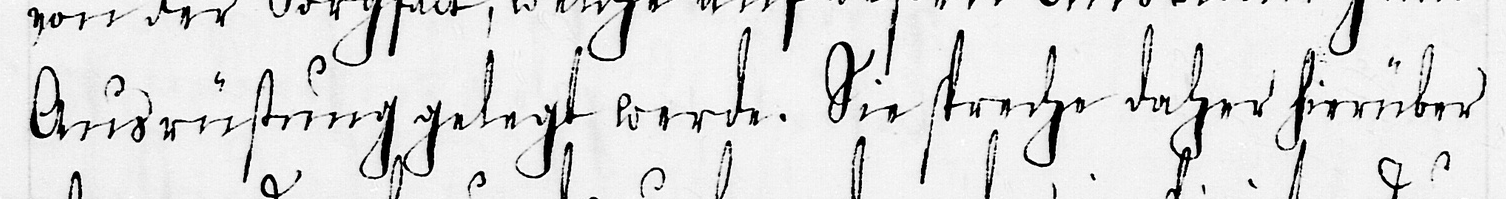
Ausrüstung gelegt werde. Sie spreche daher hierüber
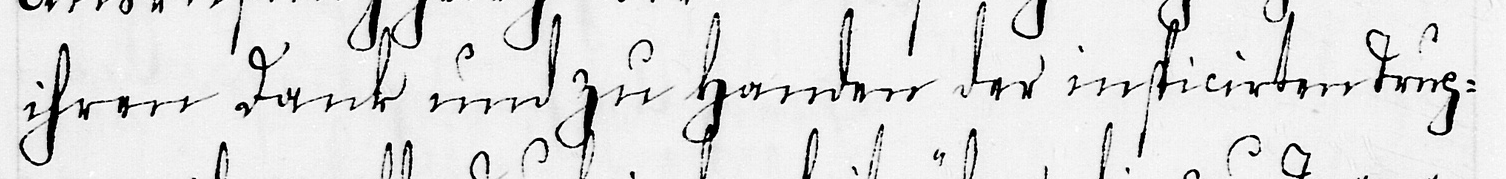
ihren Dank und zu Handen der inspicirten Trup¬
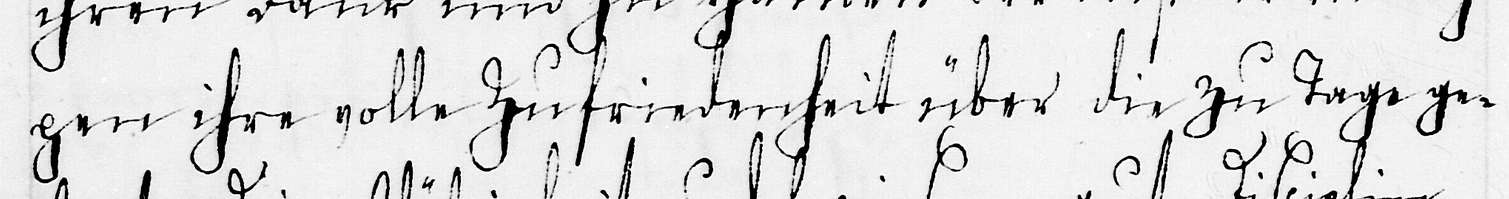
pen ihre volle Zufriedenheit über die zu Tage ge¬
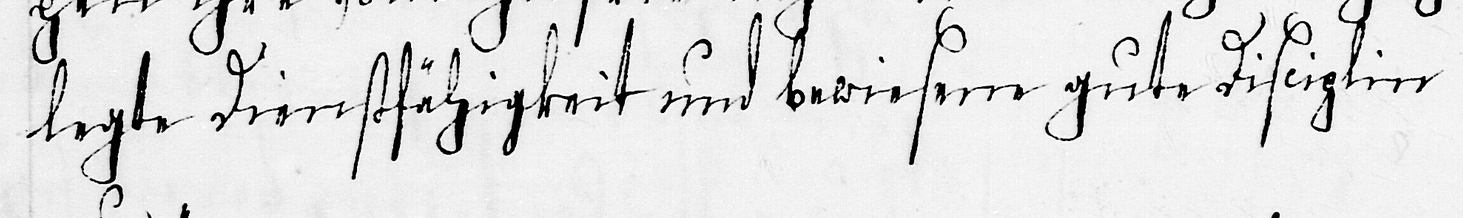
legte Dienstfähigkeit und bewiesene gute Disciplin
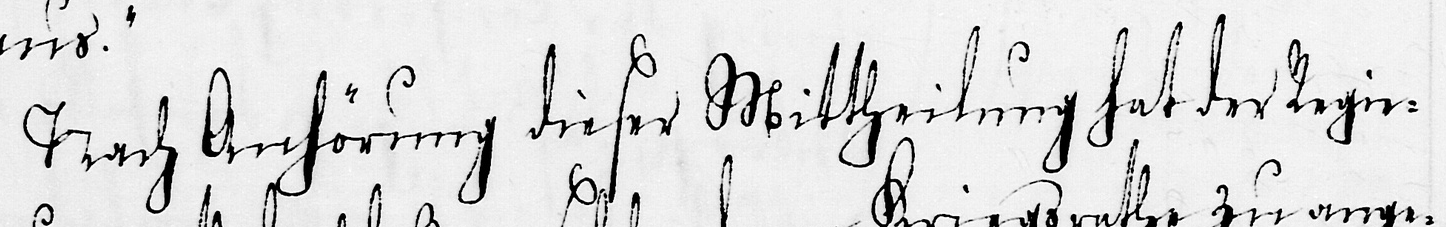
Nach Anhörung dieser Mittheilung hat der Regie¬
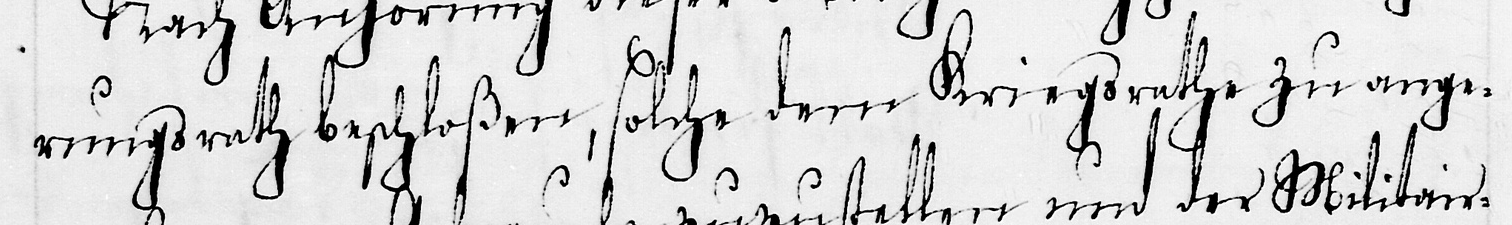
rungsrath beschloßen, solche dem Kriegsrathe zu ange¬
